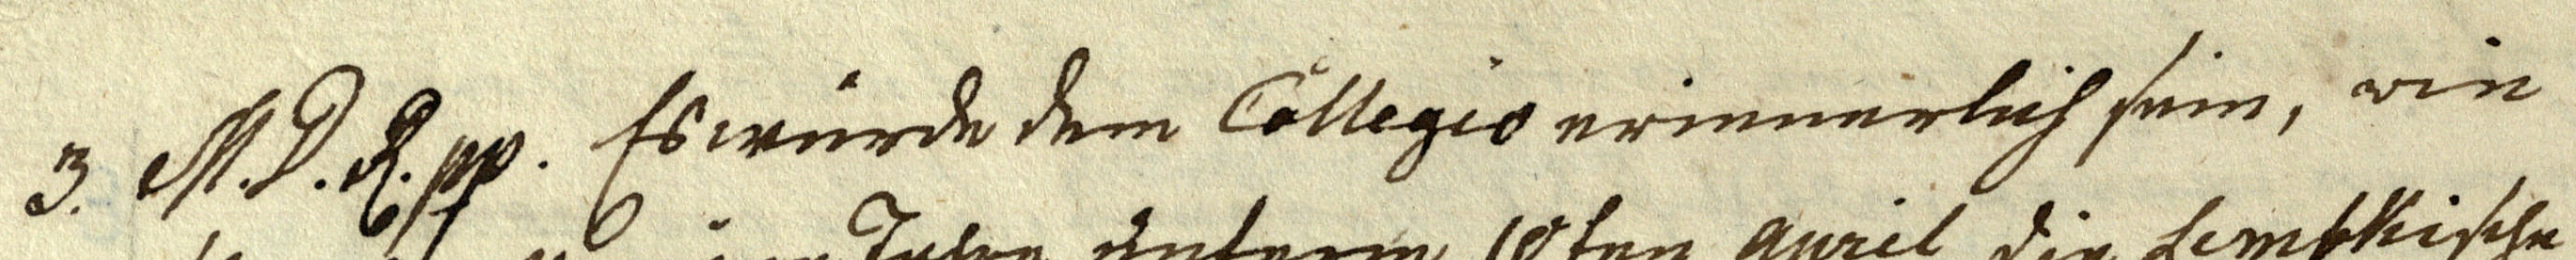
3. M. D. R. pp. Es würde dem Collegio erinnerlich sein, wie
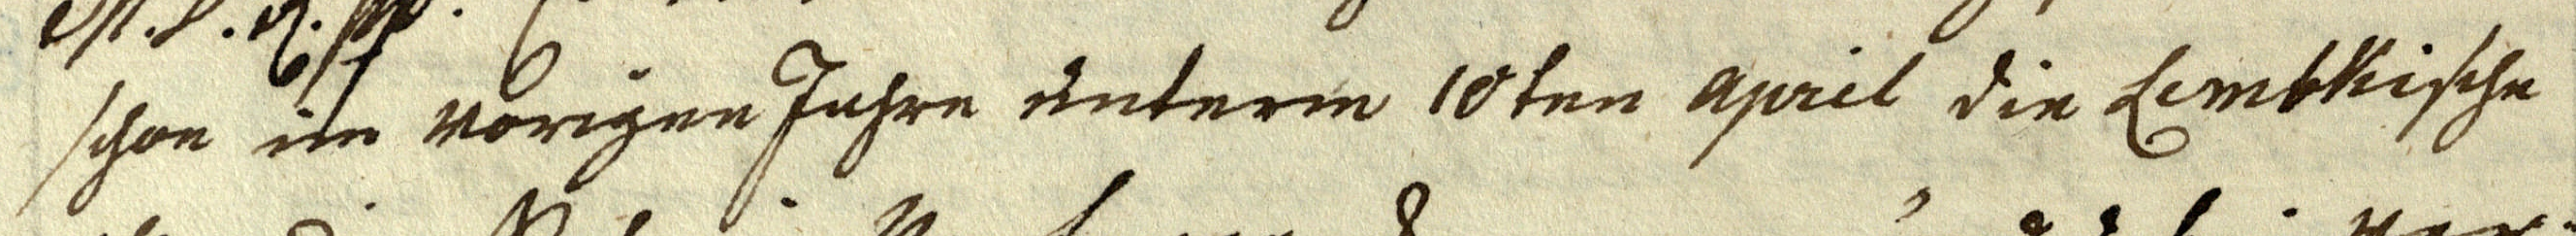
schon im vorigen Jahre unterm 10 ten April die Lembkische
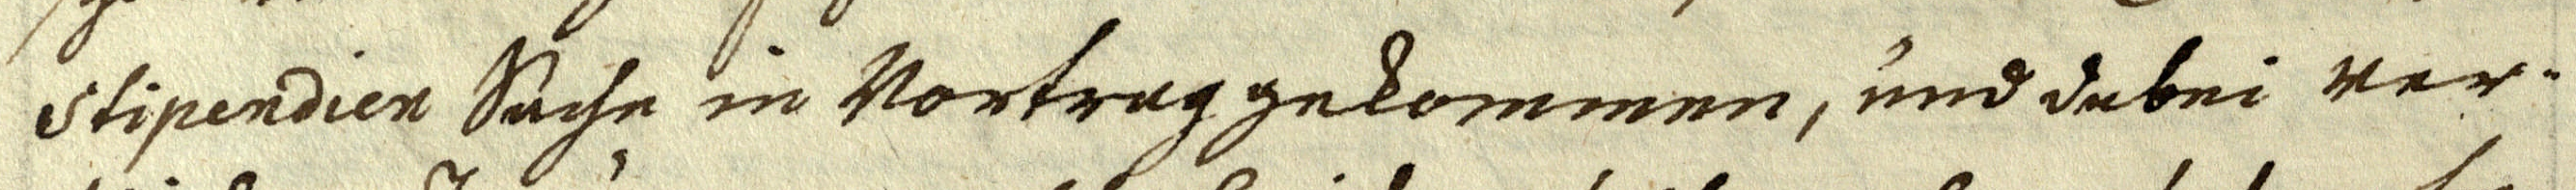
Stipendien Sache in Vortrag gekommen, und dabei ver¬
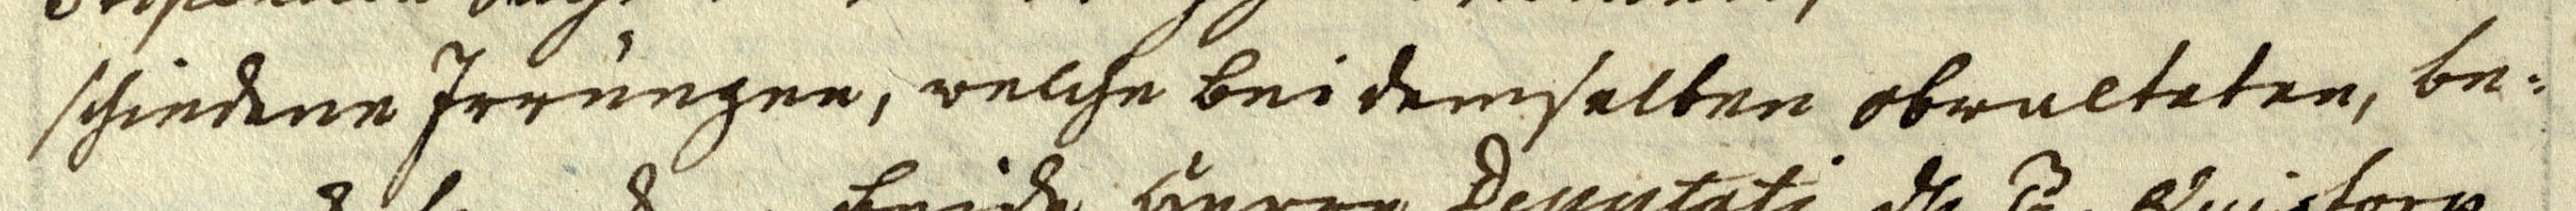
schiedene Irrungen, welche bei demselben obwalteten, be¬
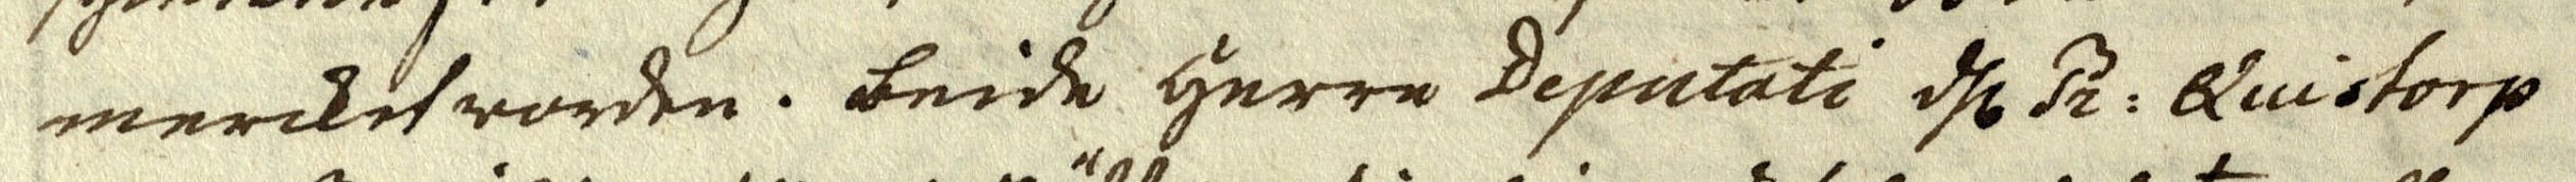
mercket worden. Beide Herrn Deputati dh. Pr. Quistorp
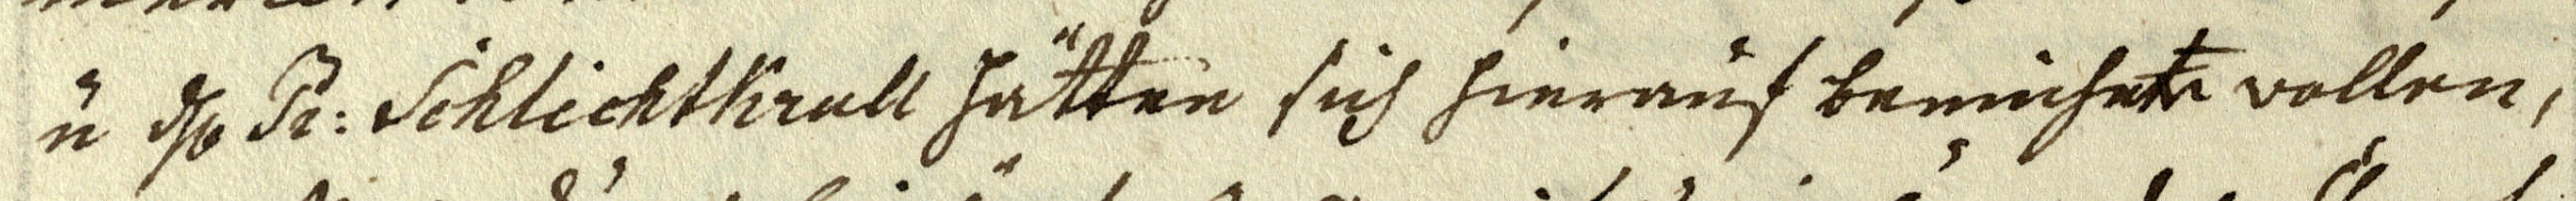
u dh. Pr. Schlichtkrull hätten sich hierauf bemühetn wollen,
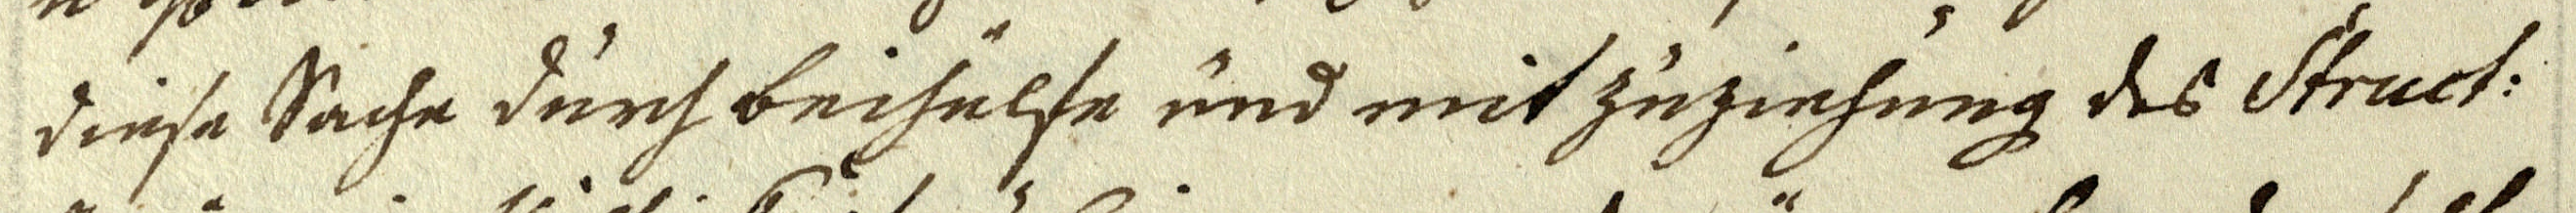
diese Sache durch Beihülfe und mit Zuziehung des Struct.
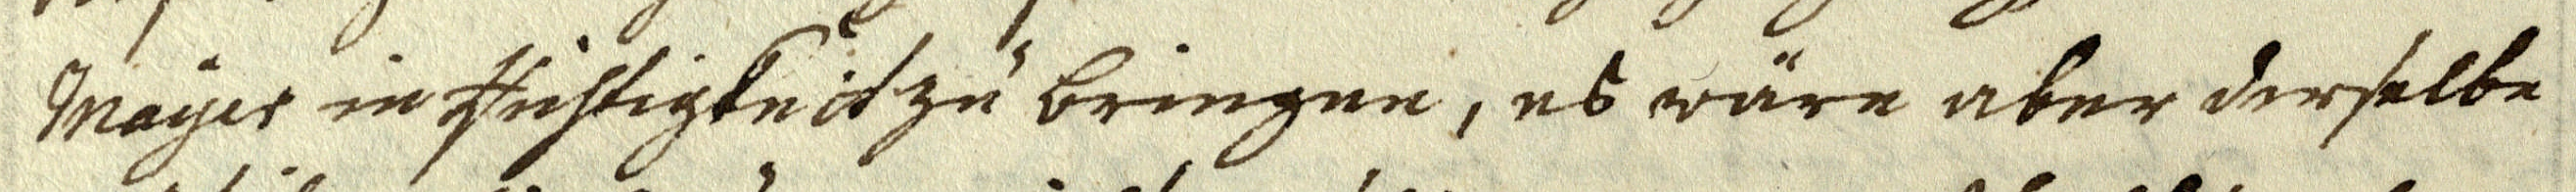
Maÿer in Richtigkeit zu bringen, es wäre aber derselbe
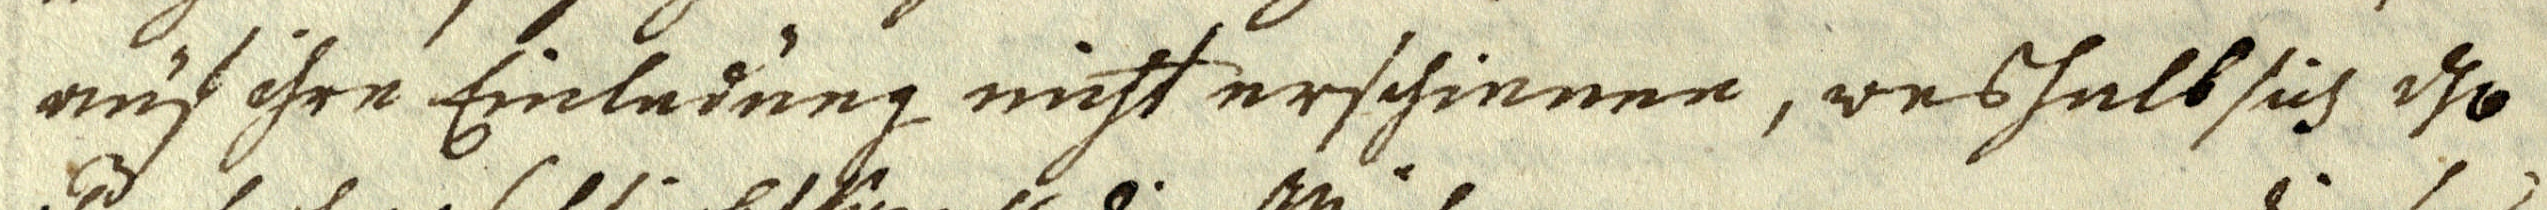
auf ihre Einladung nicht erschienen, weshalb sich dh.
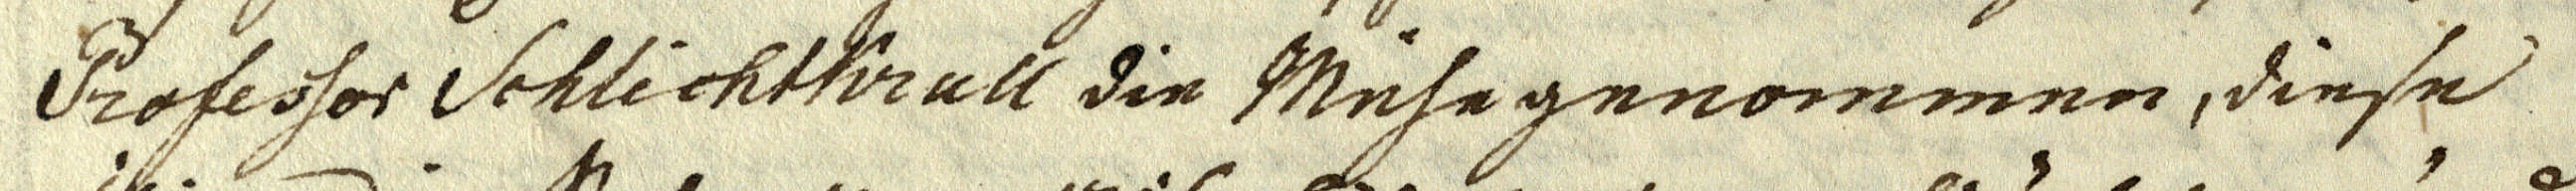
Professor Schlichtkrull die Mühe genommen, diese
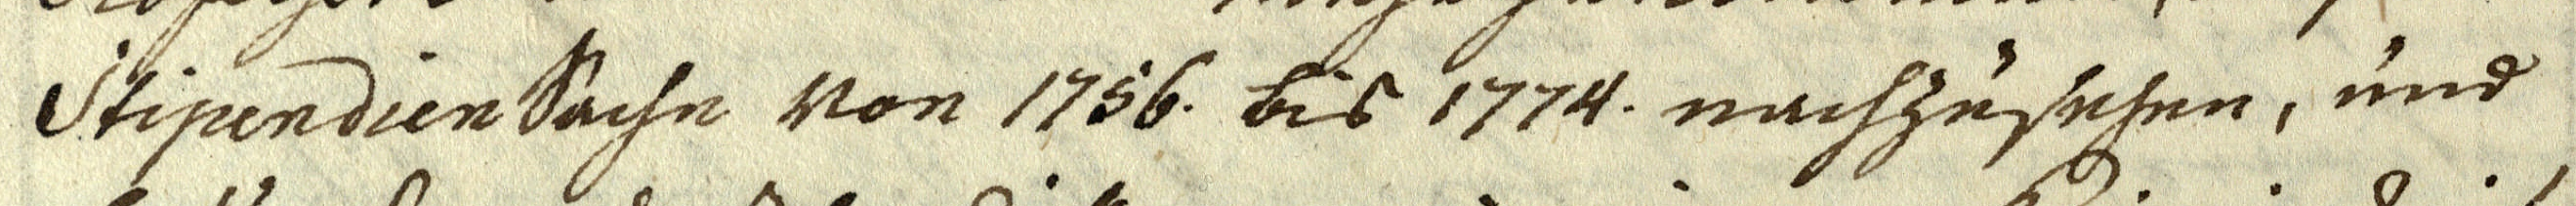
Stipendien Sache von 1756 bis1774 nachzusehen, und
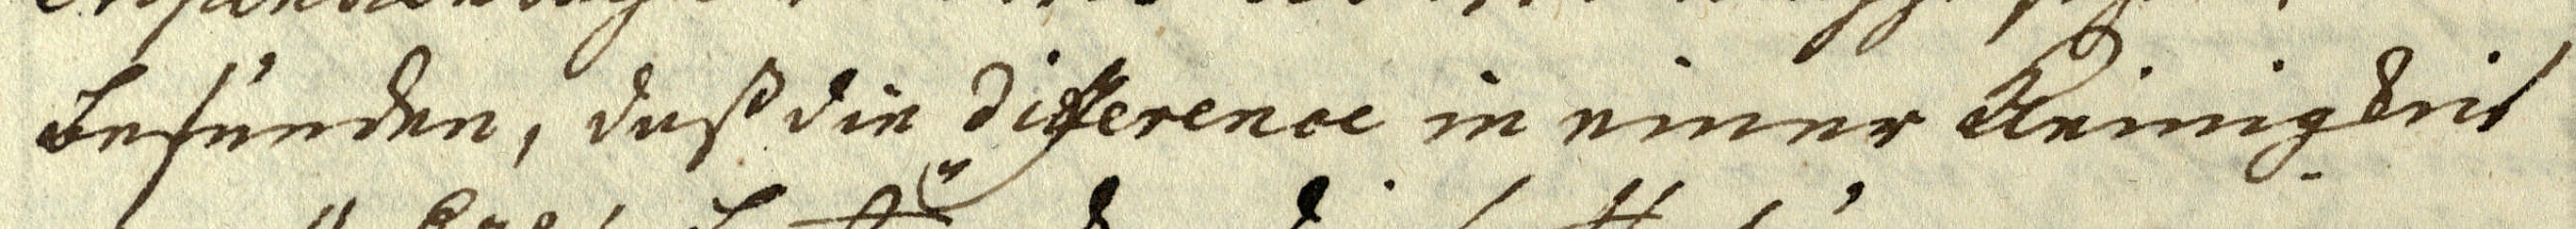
befunden, daß die difference in einer Kleinigkeit
